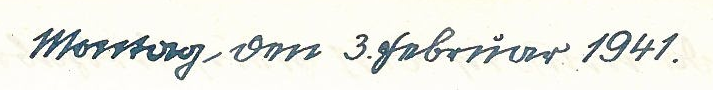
Montag, den 3. Februar 1941.
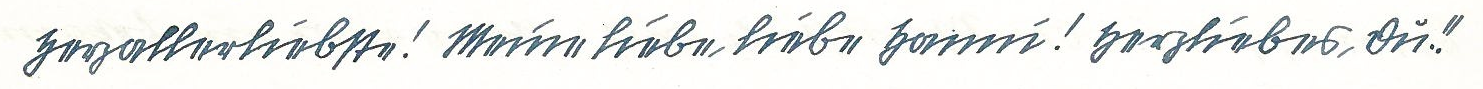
Herzallerliebste! Meine liebe, liebe! Herzliebes, Du!!
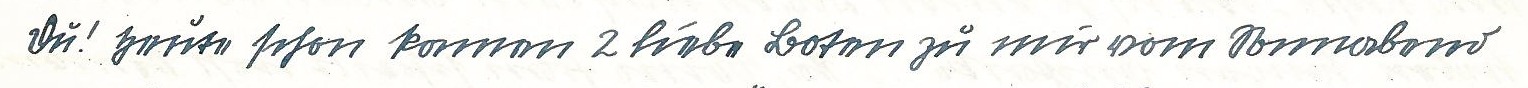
Du! Heute schon kommen 2 liebe Boten zu mir vom Sonnabend
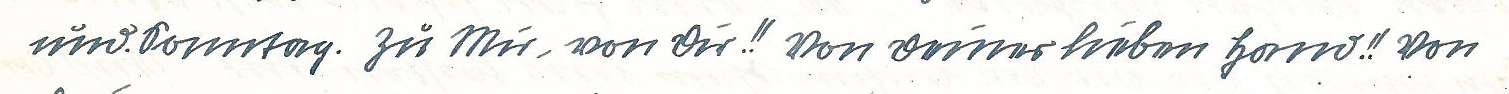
und. Sonntag. Zu Mir, von Dir!! Von Deiner lieben Hand!! Von
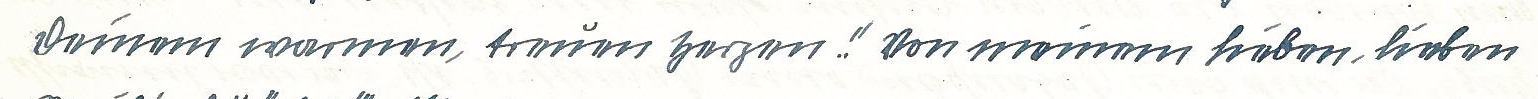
Deinem warmen, treuen Herzen!! Von meinem lieben, lieben
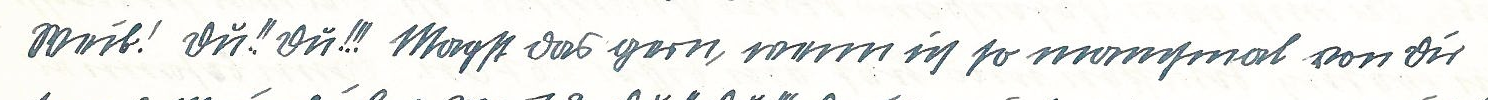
Weib! Du!! Du!!! Magst das gern, wenn ich so manchmal von Dir
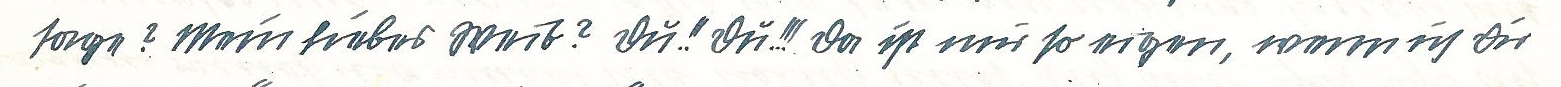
sage? Mein liebes Weib? Du!! Du!!! Da ist mir so eigen, wenn ich Dir
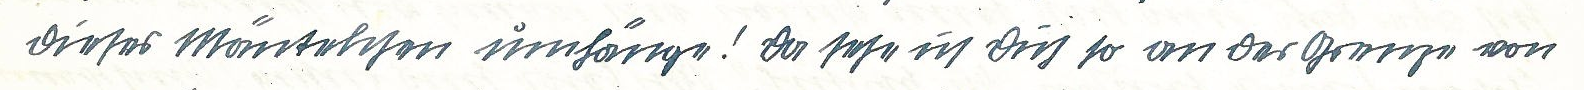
dieses Mäntelchen umhänge! Da sehe ich Dich so an der Grenze von
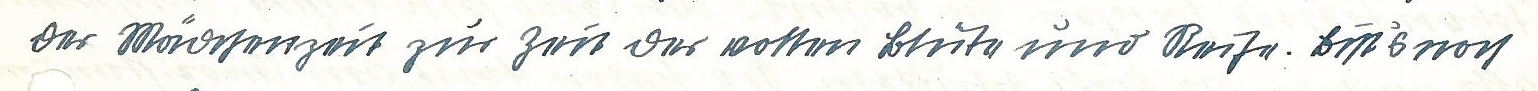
der Mädchenzeit zur Zeit der vollen Blüte und Reife. Bist’s noch
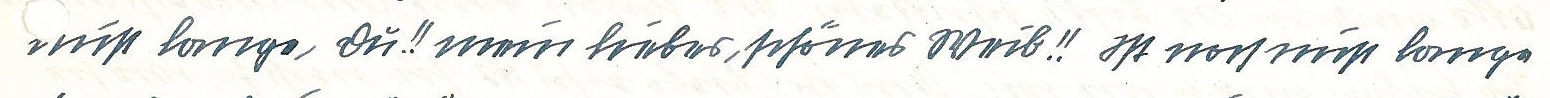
icht lange, Du!! mein liebes, schönes Weib!! Ist noch nicht lange
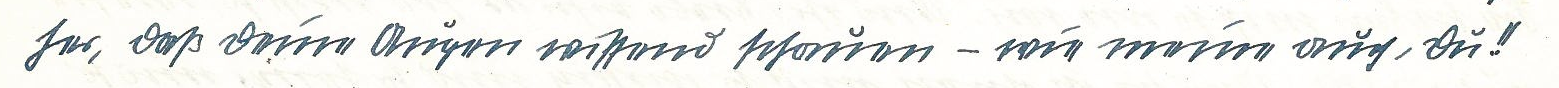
her, daß Deine Augen wissend schauen – wie meine auch, Du!!
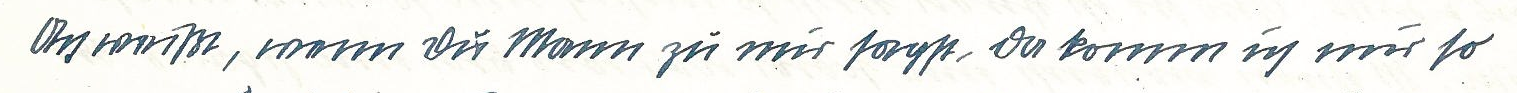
Ach weißt, wenn Du Mann zu mir sagst, da komme ich mir so
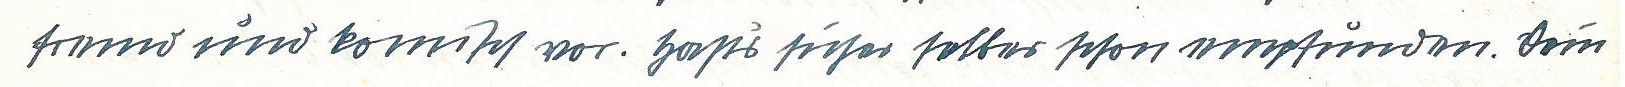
fremd und komisch vor. Hast’s sicher selber schon empfunden. Dein
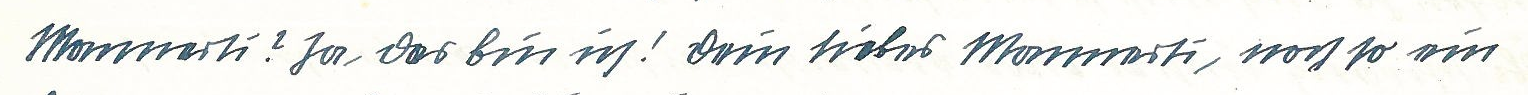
Mannerli? Ja, das bin ich! Dein liebes Mannerli, noch so ein
